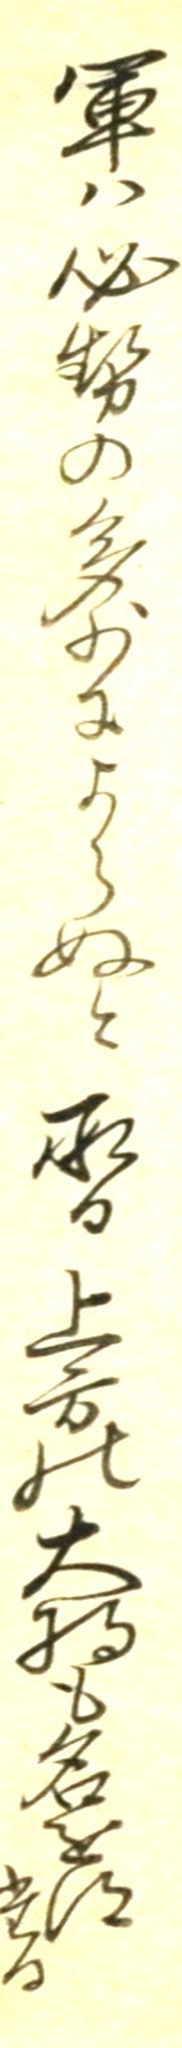軍は必勢の多少によらぬと承る上方の大将も名を得たる
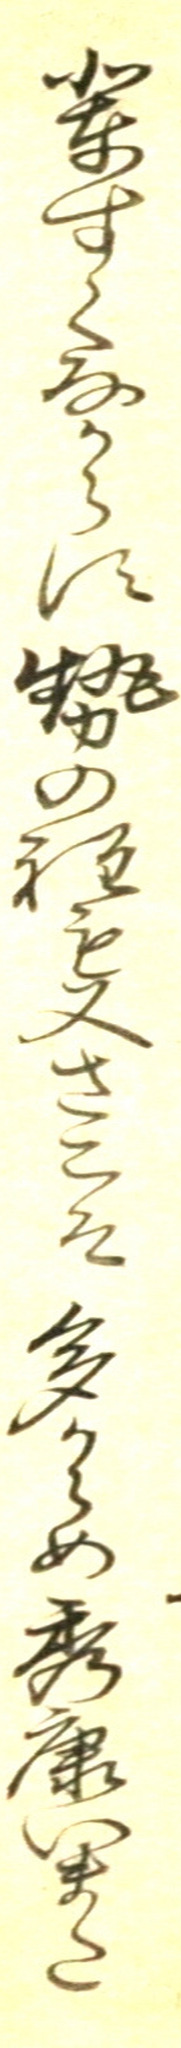輩すくなからす勢の程も又さこそ多からめ秀康いまた
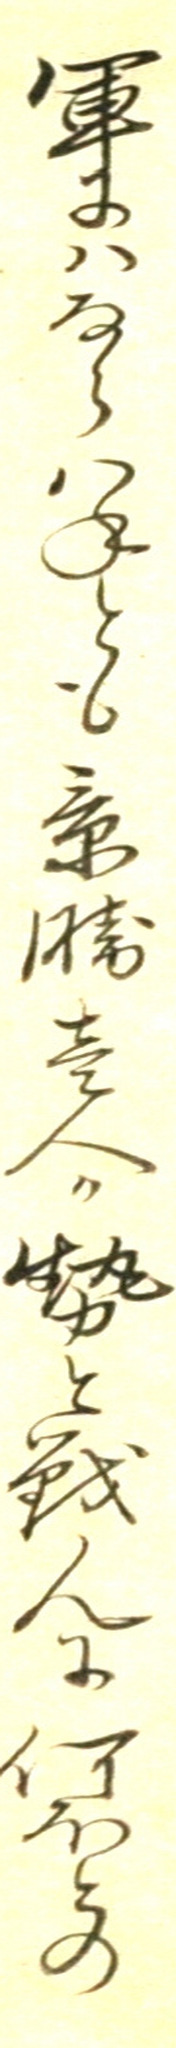軍にはならはねとも景勝壱人か勢と戦んに何ほとの
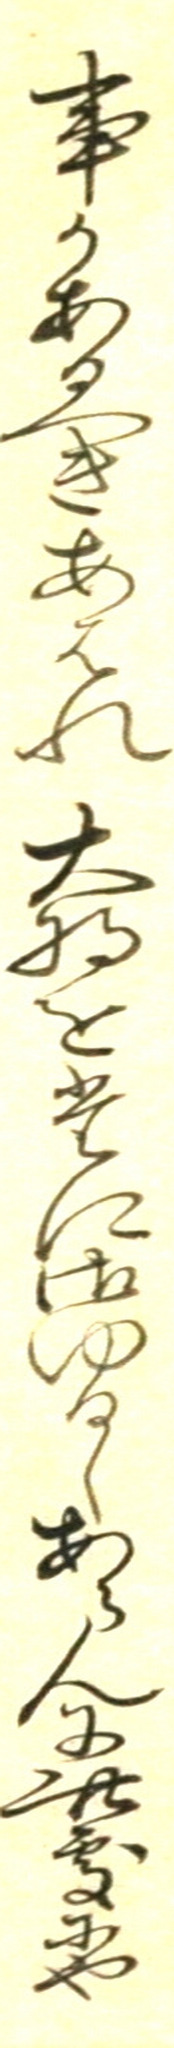事かあるへきあはれ大将をたに御ゆるしあらんに此処にや
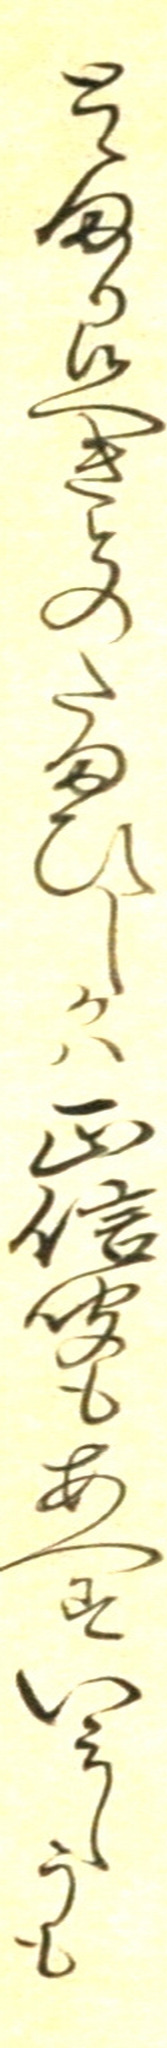とゝまり候へきとのたまひしかは正信聞もあへすいみしうも
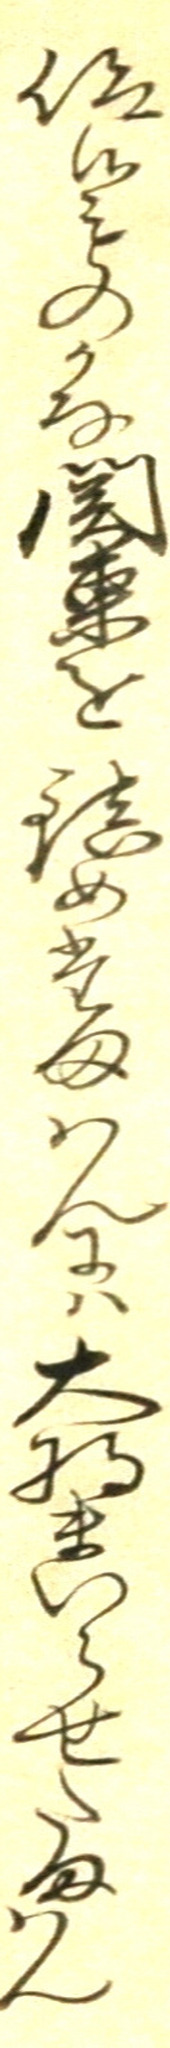仰候ものかな関東を鎮めたまはんには大将まいらせたまはん
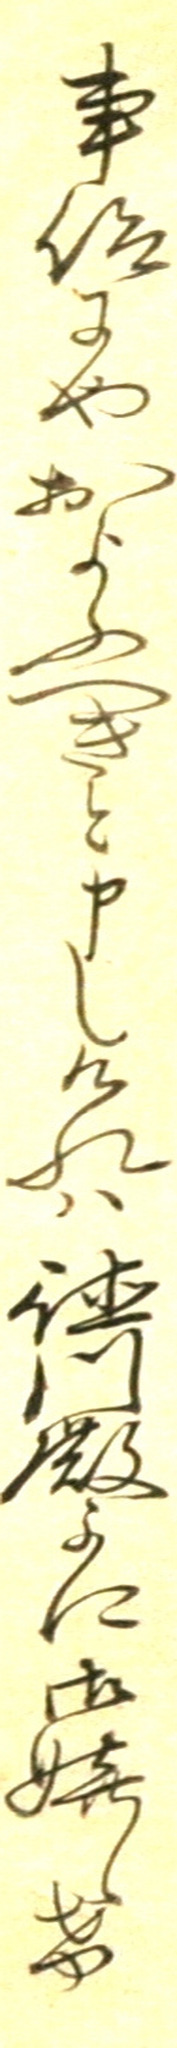事仰にやおよふへきと申しけれは徳川殿よに御嬉しけ
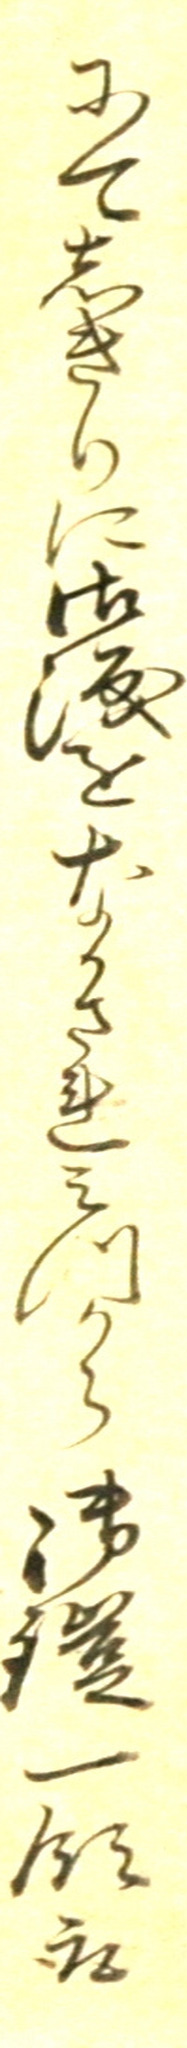にてしきりに御涙をなかされみつから御鎧一領取

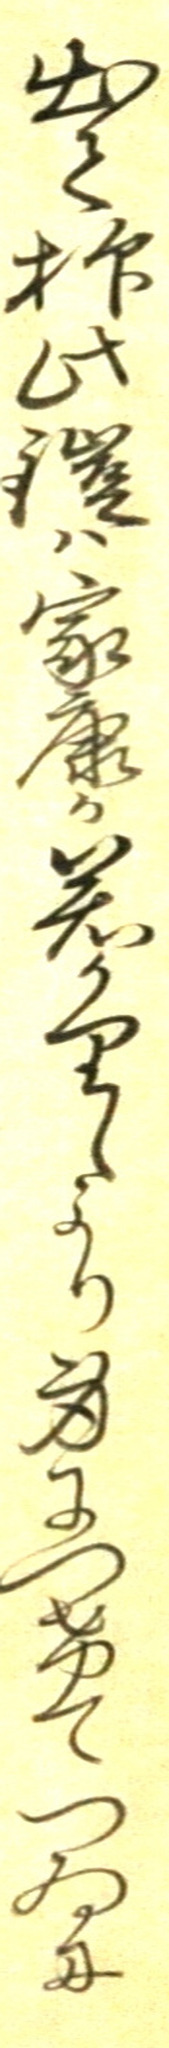出て抑此鎧は家康か若かりしより身につけてつゐに
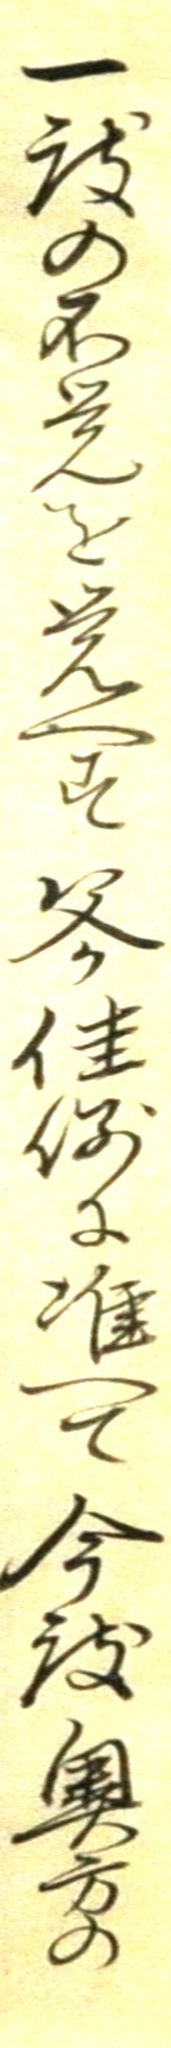一度の不覚を覚へす父か佳例に准へて今度奥方の
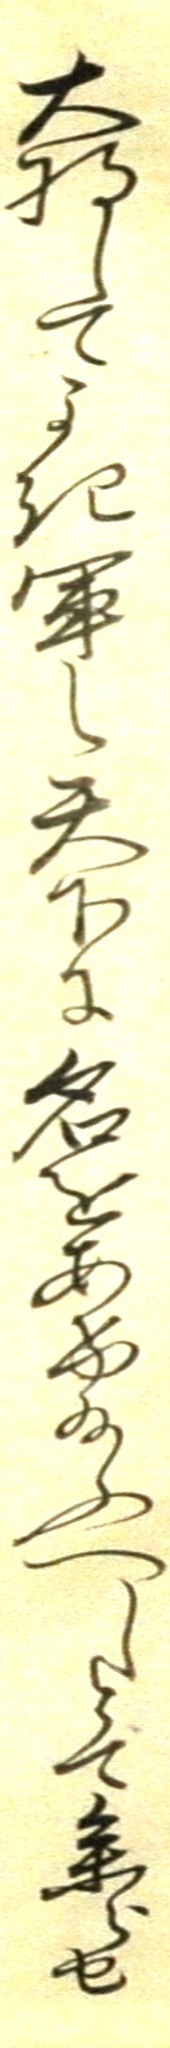大将してよき軍し天下に名をあけ給ふへしとて参らせ
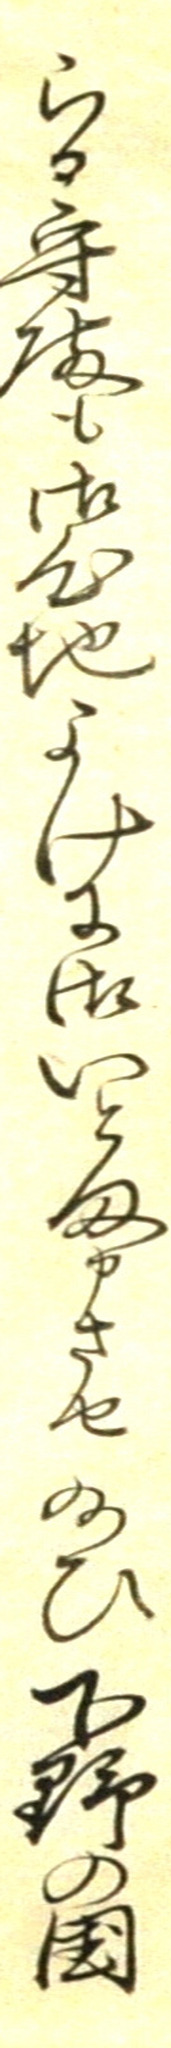らる守殿も御心地よけに御いとま申させ給ひ下野の国
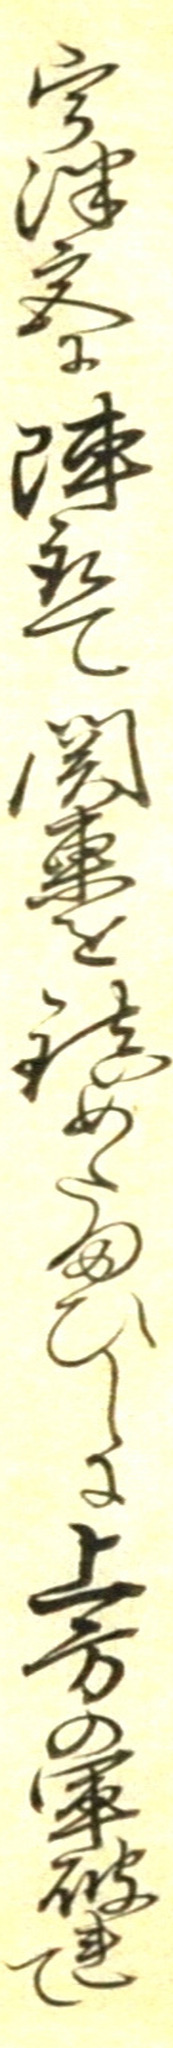宇津宮に陣取て関東を鎮めたまひしに上方の軍破れて
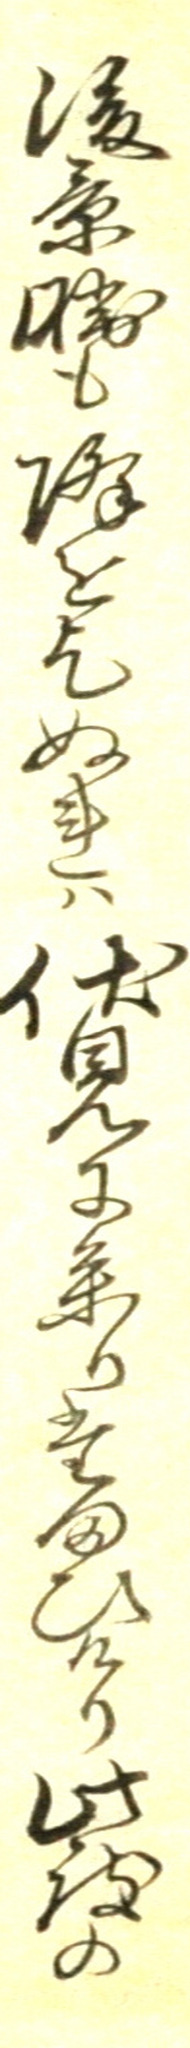後景勝も降を乞ぬれは伏見に参りたまひけり此度の
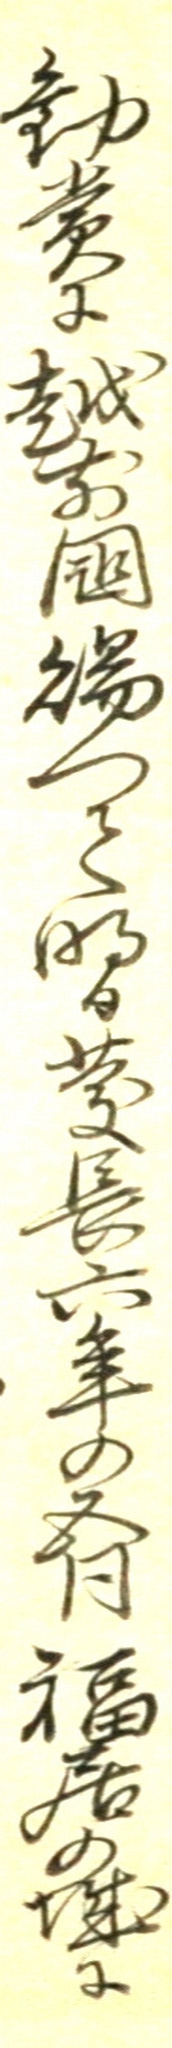勧賞に越前国賜つて明る慶長六年の五月福居の城に
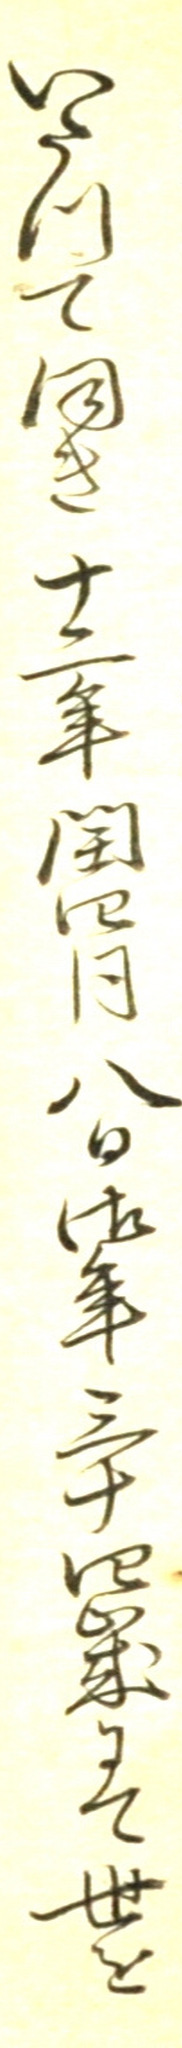いたつて同き十二年閏四月八日御年三十四歳にて世を
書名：藩翰譜（一）
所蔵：伊那市立高遠町図書館・合同会社AMANE
